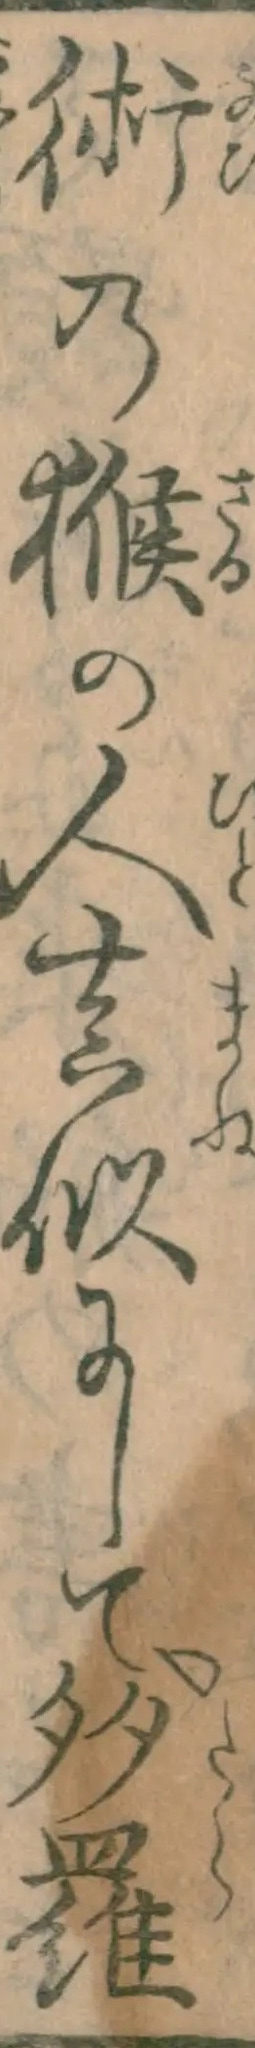術の猴の人真似にして、多羅
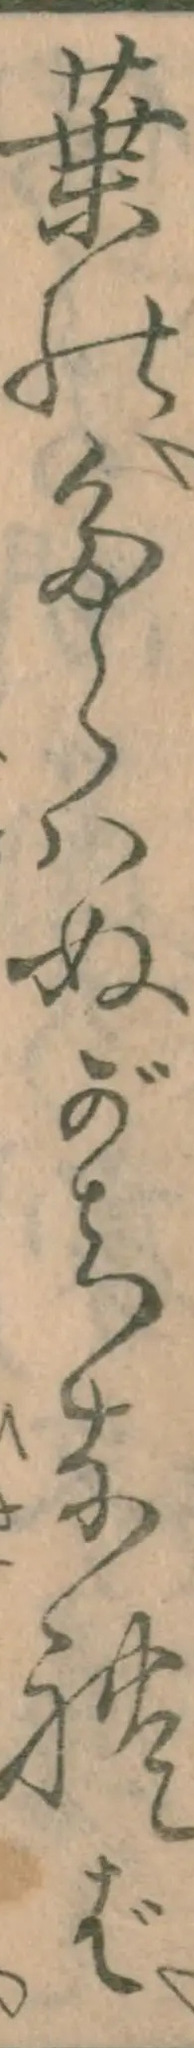葉の、たらはぬがちなれば、
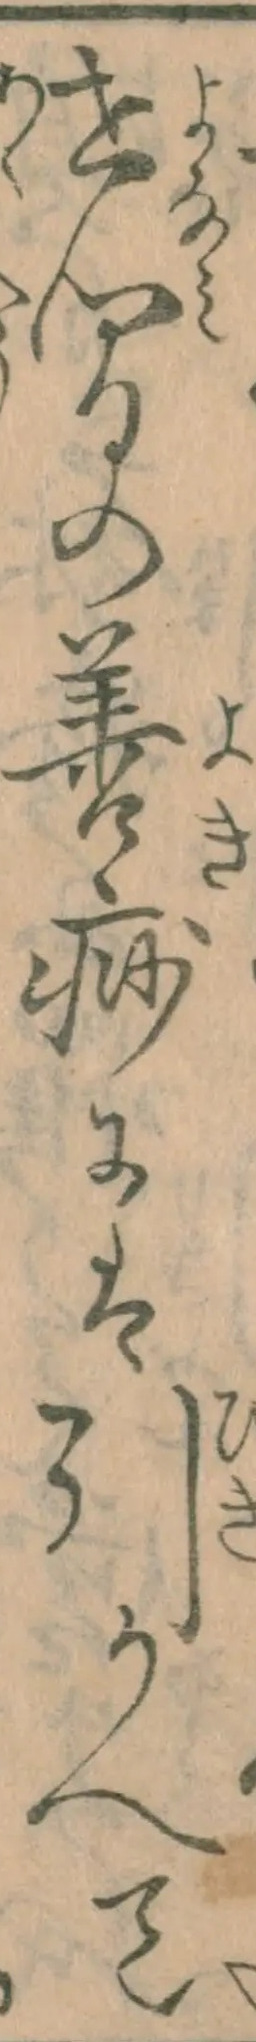世間の善痧には引かへて、
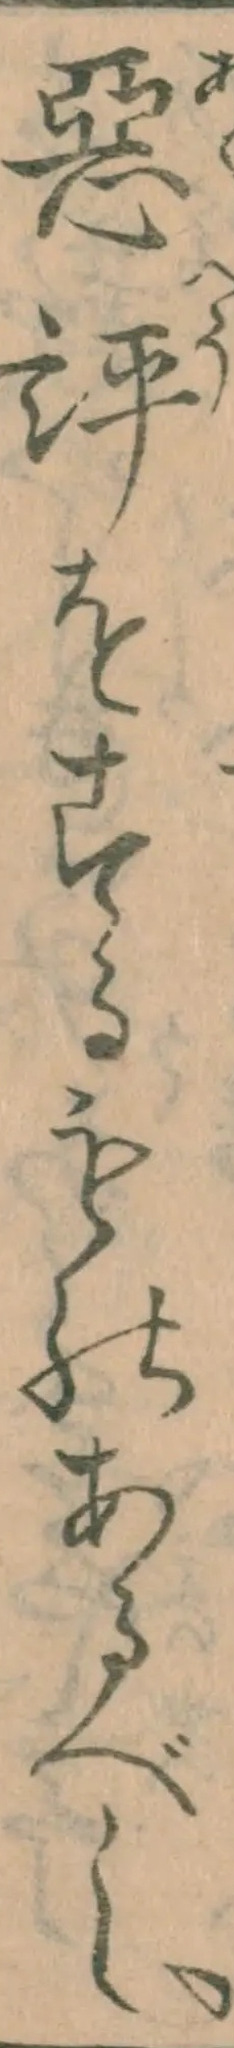悪評をするものあるべし、
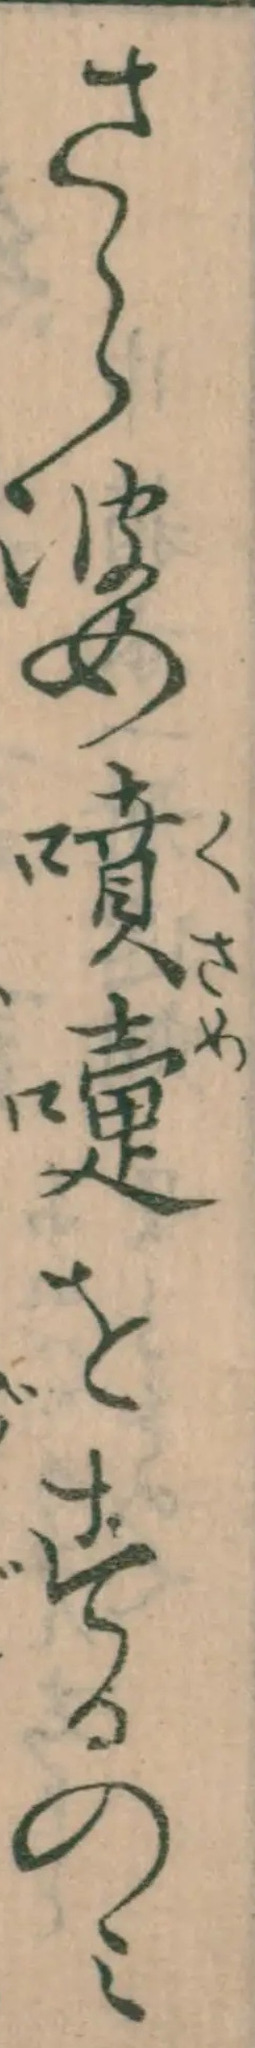さら婆噴嚔をするのみ
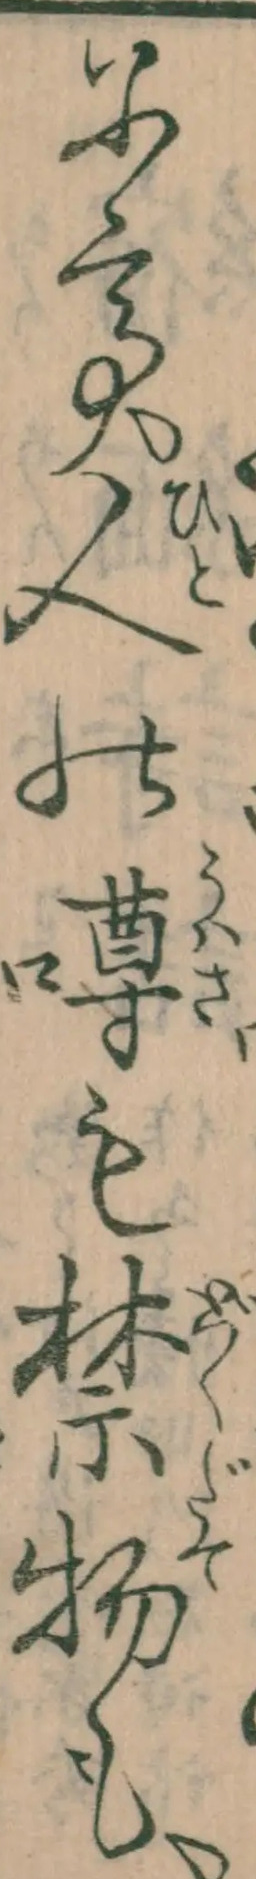にて、人の噂も禁物も、
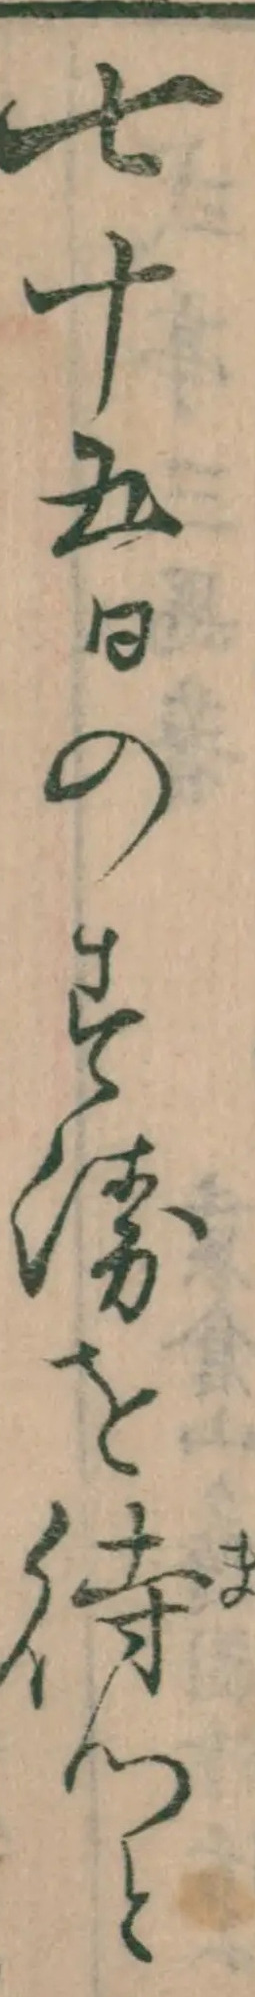七十五日のすゑを待つと
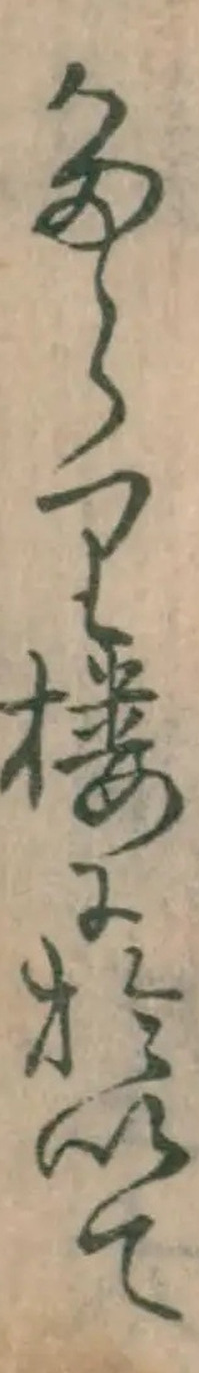たらり楼に於いて
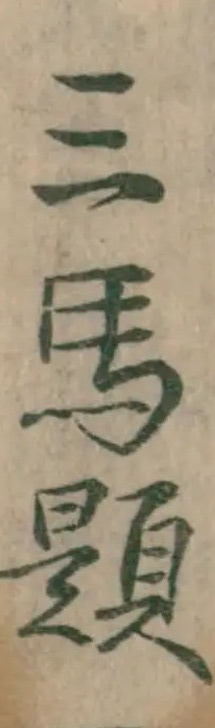三馬題

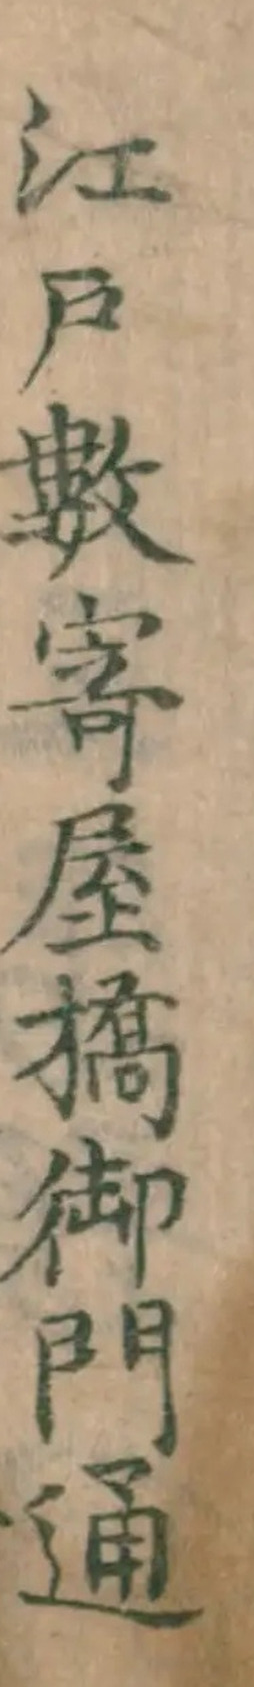江戸数寄屋橋御門通
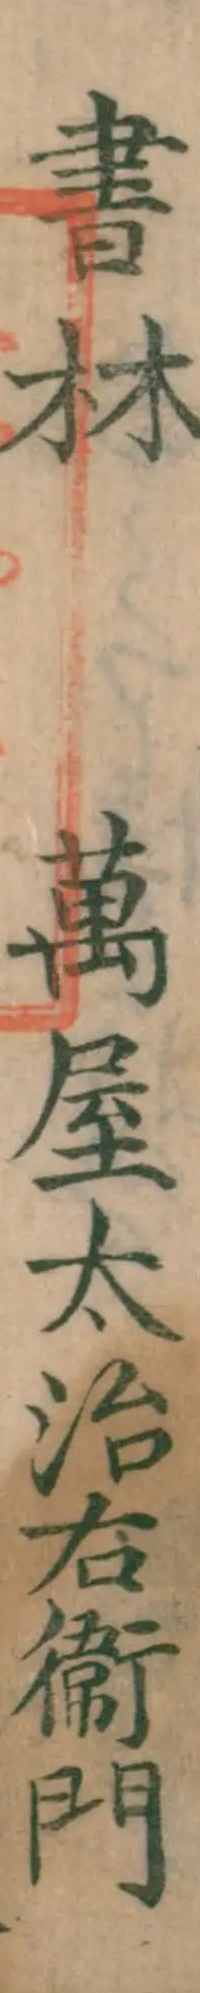書林万屋太治右衛門
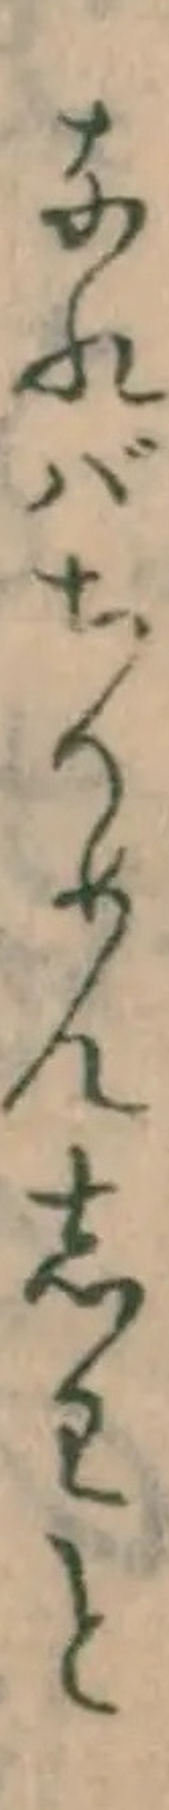なればちりめんしわと
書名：麻疹戯言
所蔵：国立国会図書館 National Diet Library, JAPAN
